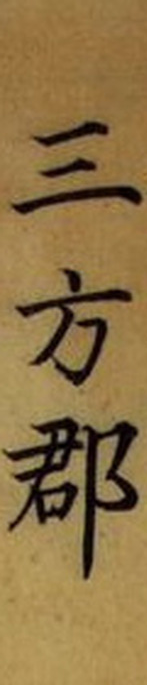三方郡
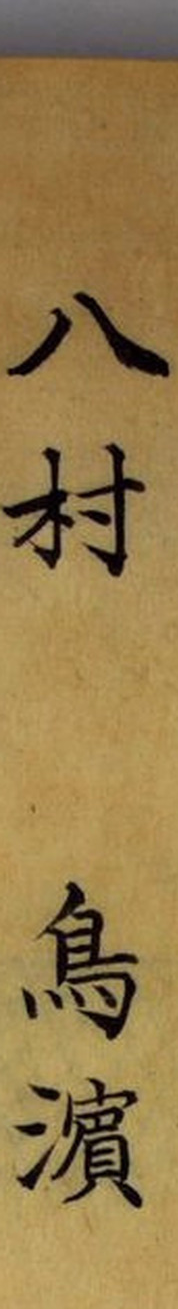八村鳥濵

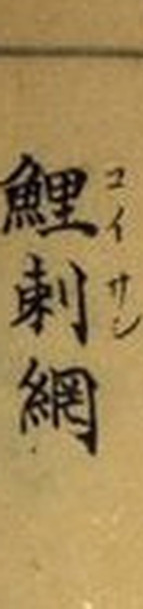鯉刺網

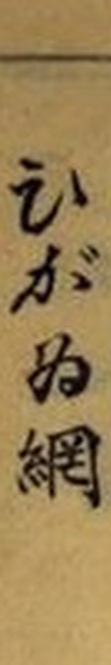ひがゐ網

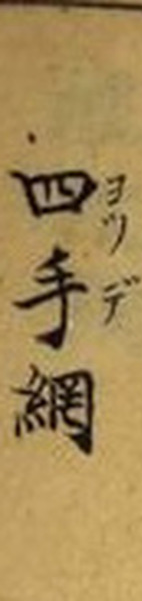四手網

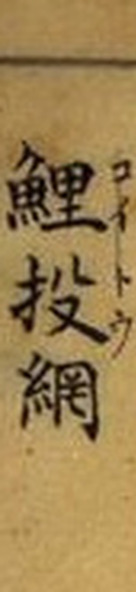鯉投網

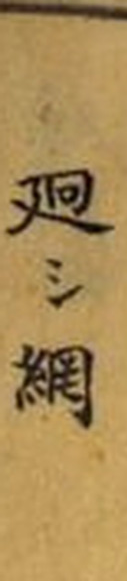廻シ網

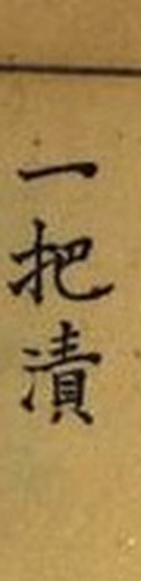一把漬

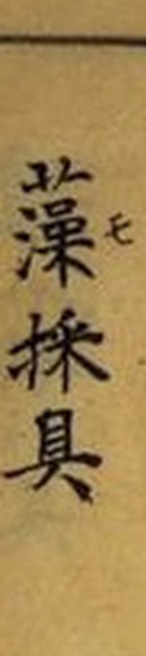藻採具

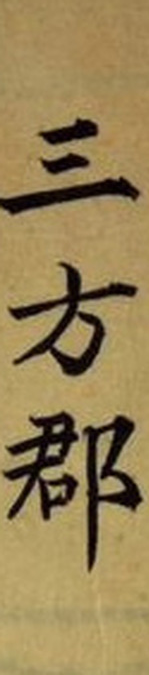三方郡
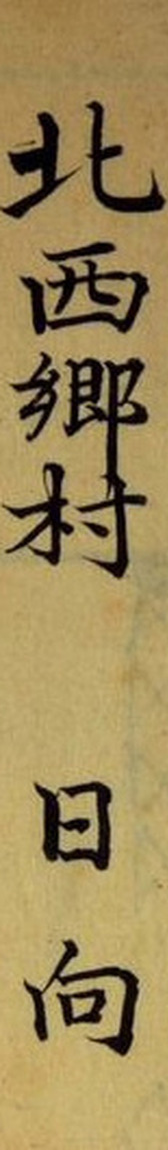北西郷村日向

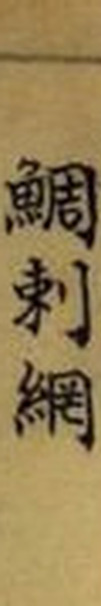鯛刺網

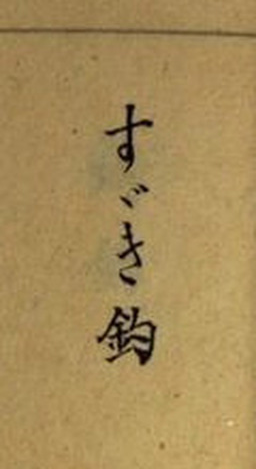すゞき釣

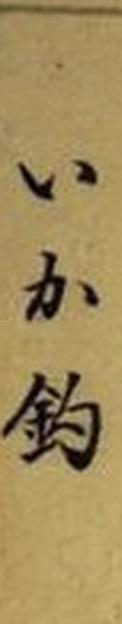いか釣

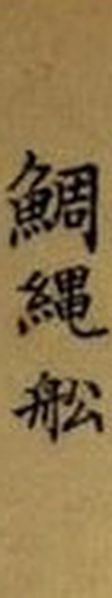鯛縄舩

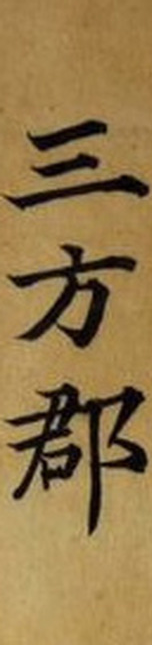三方郡
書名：漁具図 若狭海ノ部[画像あり]
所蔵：福井県文書館 Fukui Prefectural Archives
